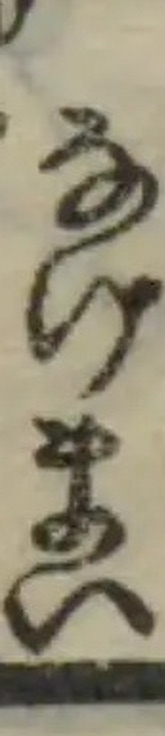なけまい
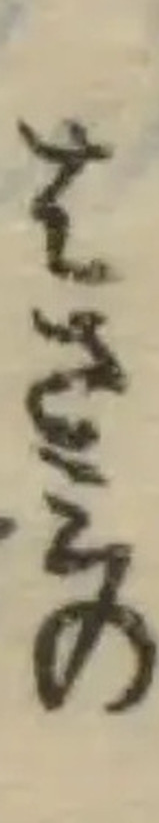はさみの
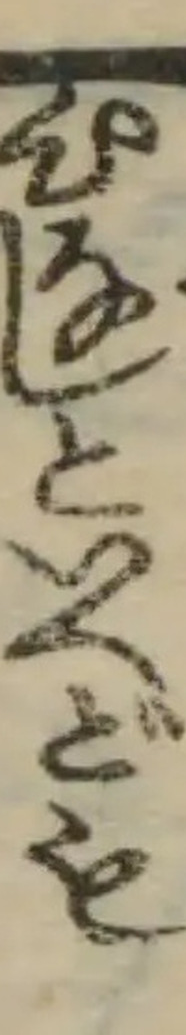心なしといへども
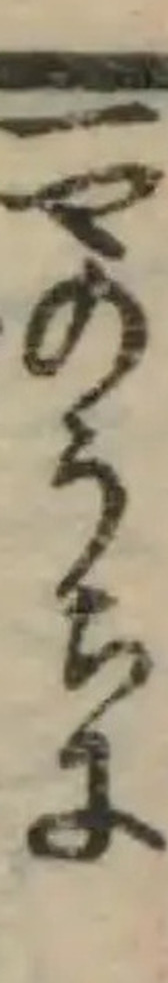一やのうちに
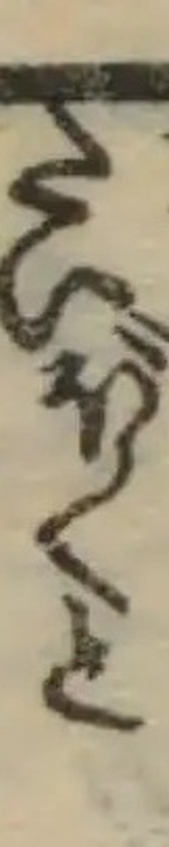たいぼくと
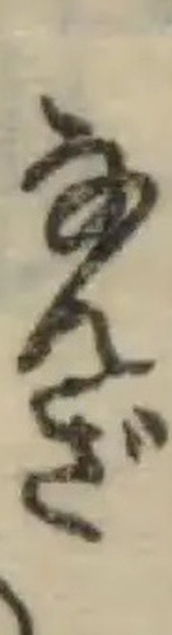なんぎ
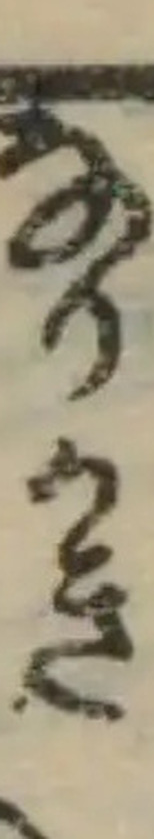なりかき
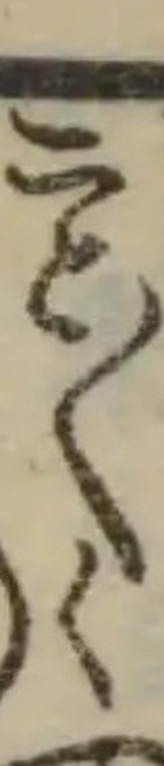こと〳〵く
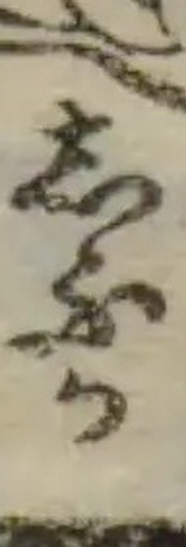しふか
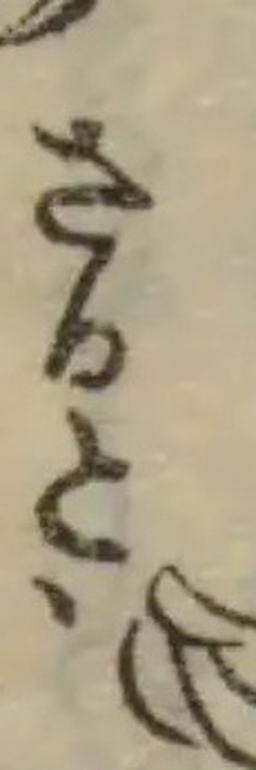さると
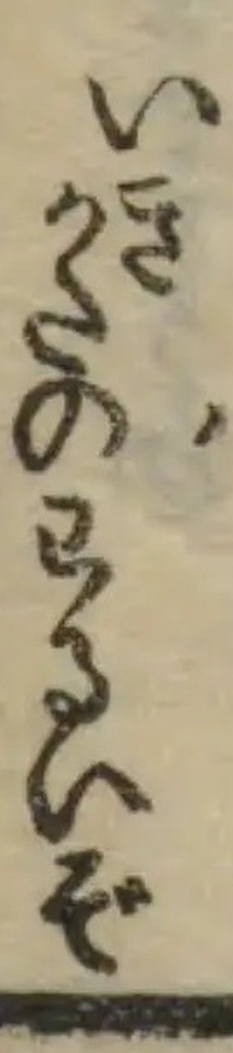かたのわるいぞ
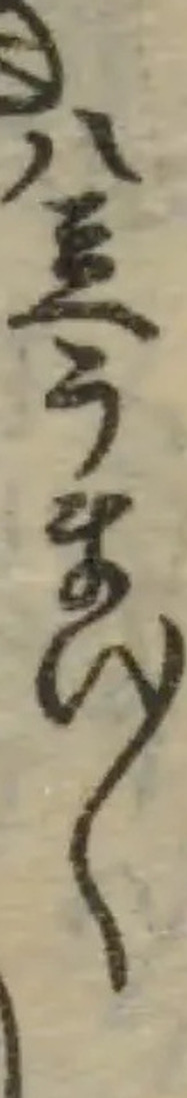八兵へうまい〳〵
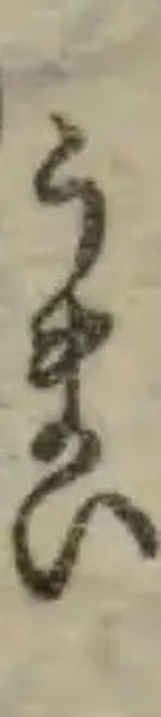うまい
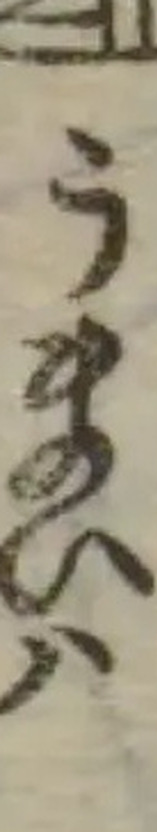うまいは
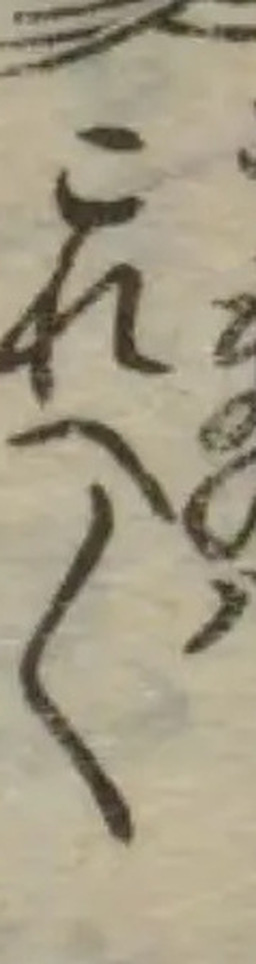これへ〳〵
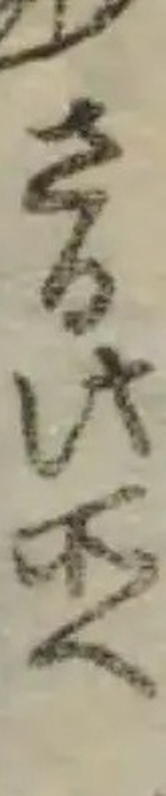さる此所へ
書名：さるかに合戦
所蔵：国立国会図書館 National Diet Library, JAPAN
